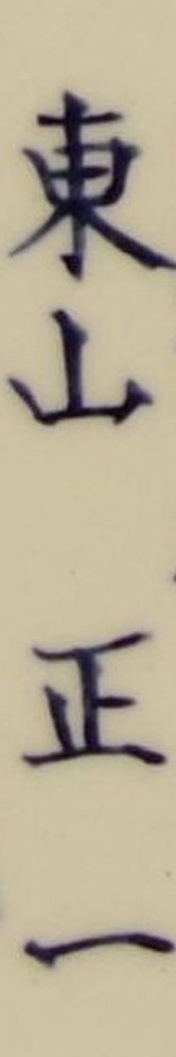東山正一
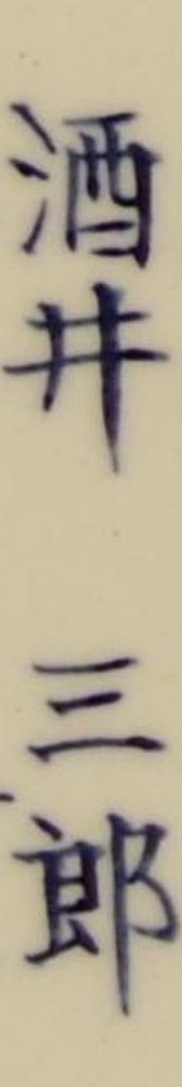酒井三郎
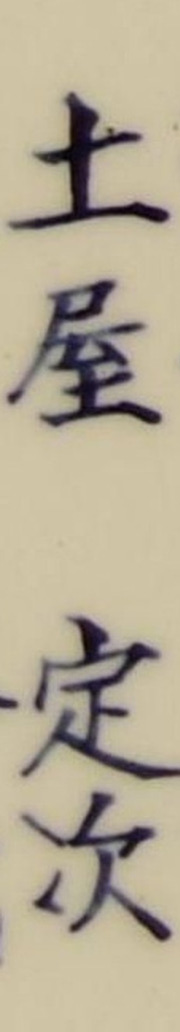土屋定次
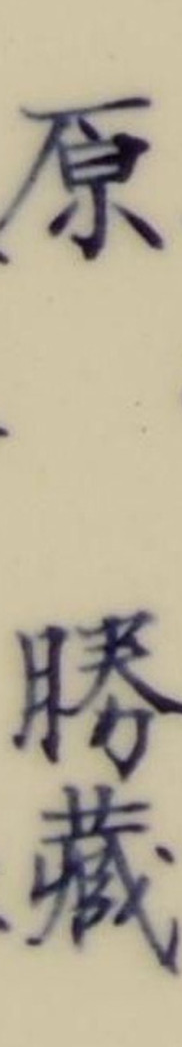原勝蔵
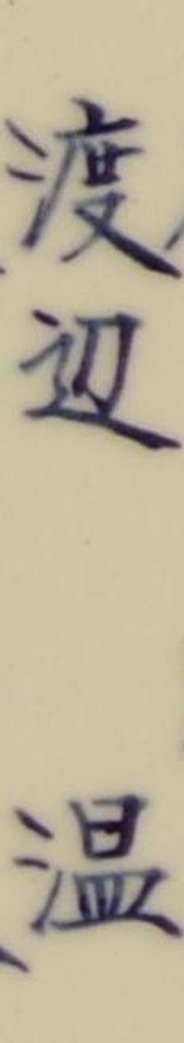渡辺温
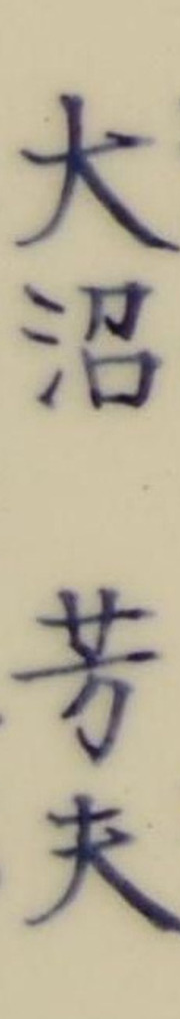大沼芳夫
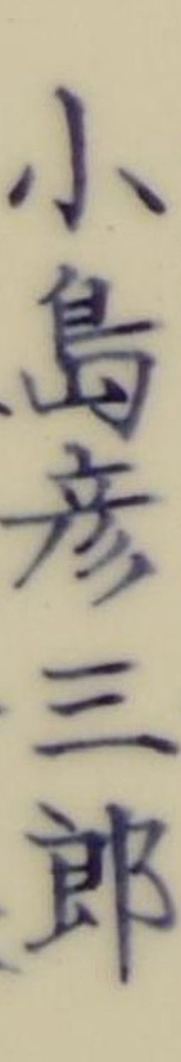小島彦三郎
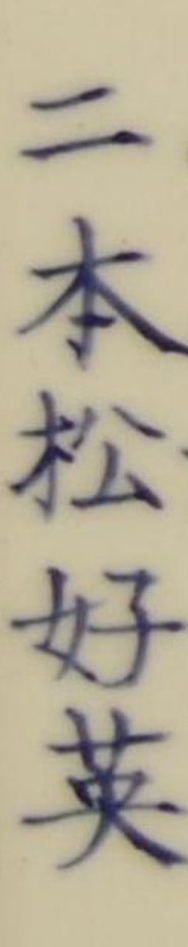二本松好英

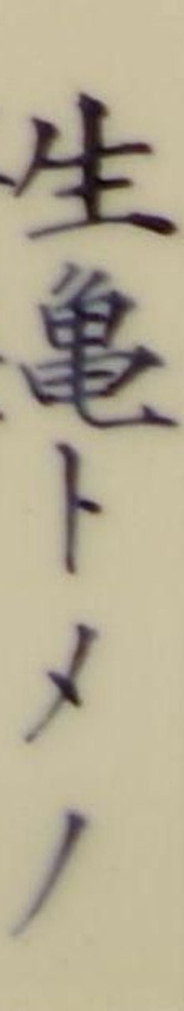生亀トメノ
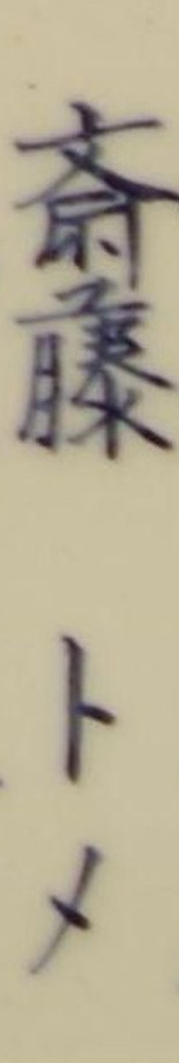斎藤トメ
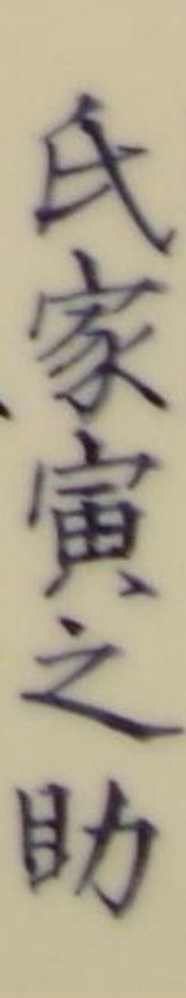氏家寅之助
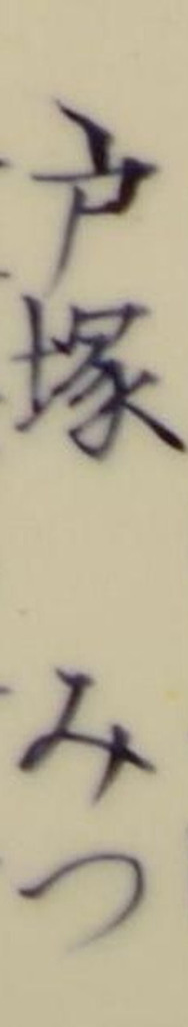戸塚みつ
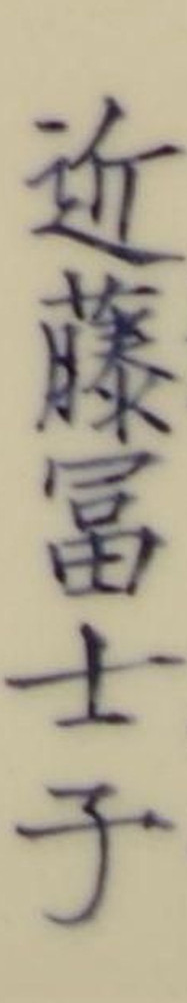近藤富士子
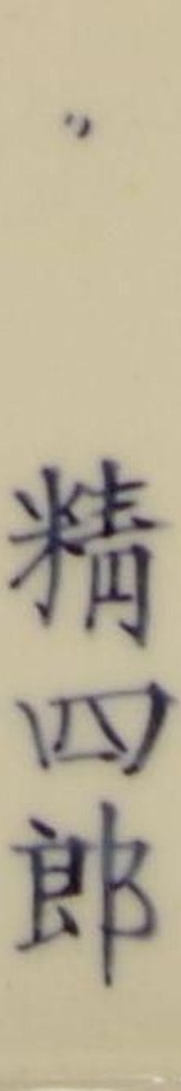精四郎
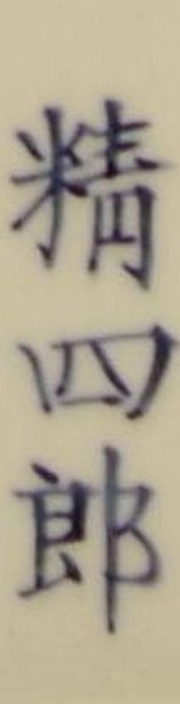精四郎
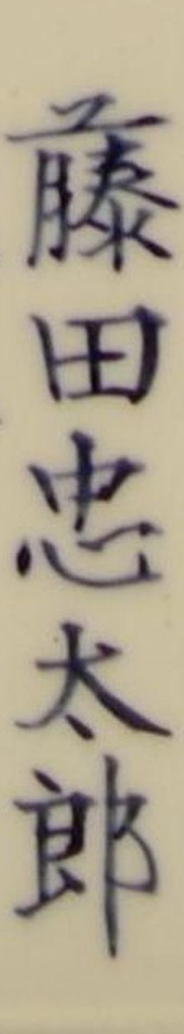藤田忠太郎
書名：E~L
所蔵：高野山金剛峯寺
